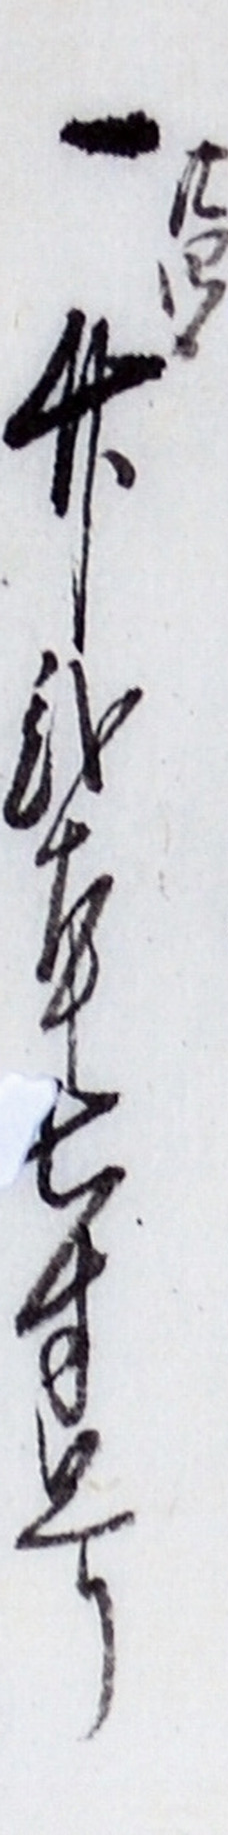一竹弐本七寸廻り
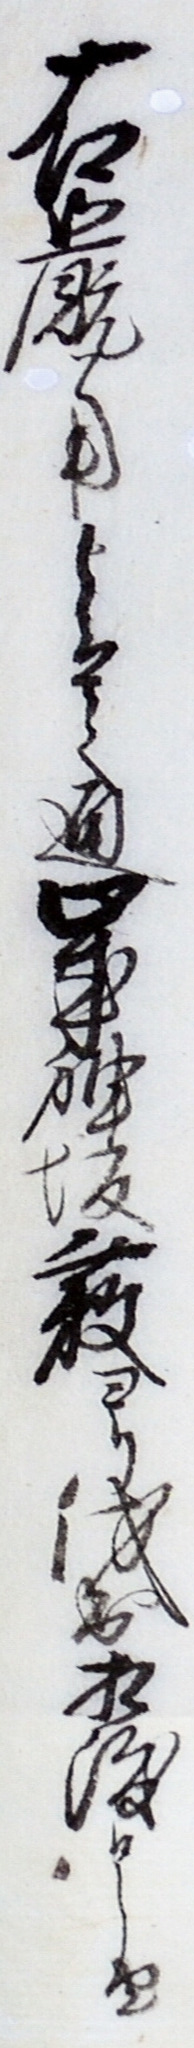右御厩用申立之通歳神坂藪ヨリ伐出相渡申由
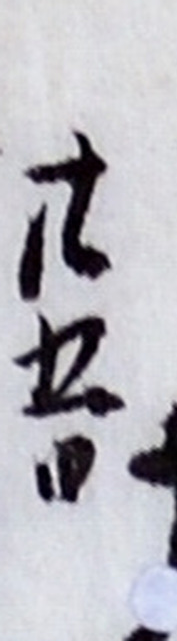廿四日
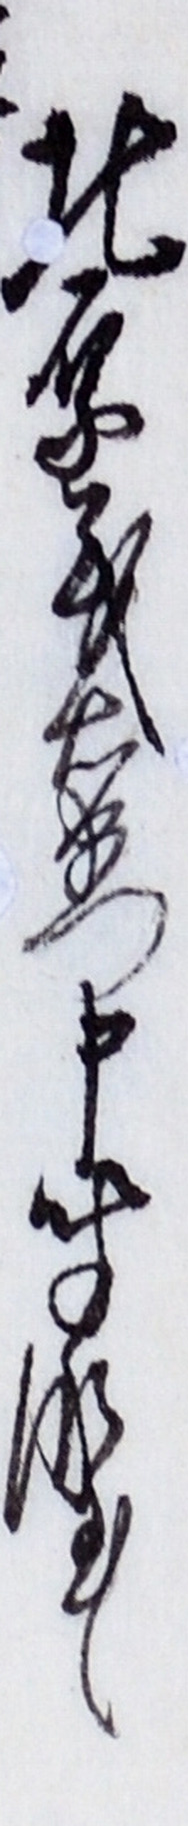北原義右衛門申聞承置候
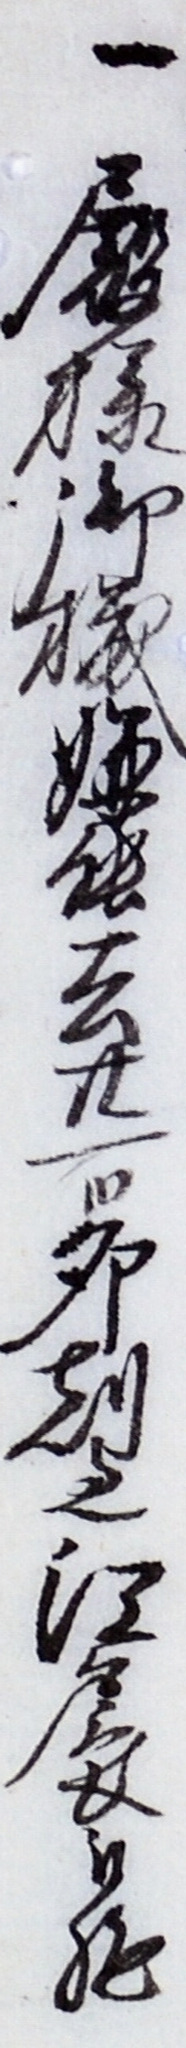一殿様御機嫌能去廿一日卯刻過江戸表被遊
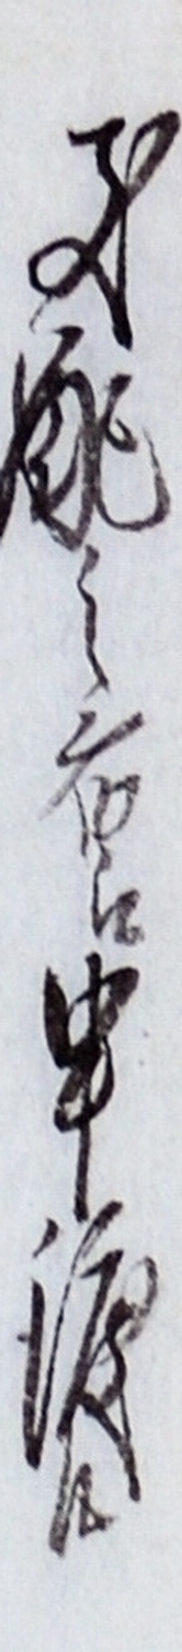支配之者江申渡候
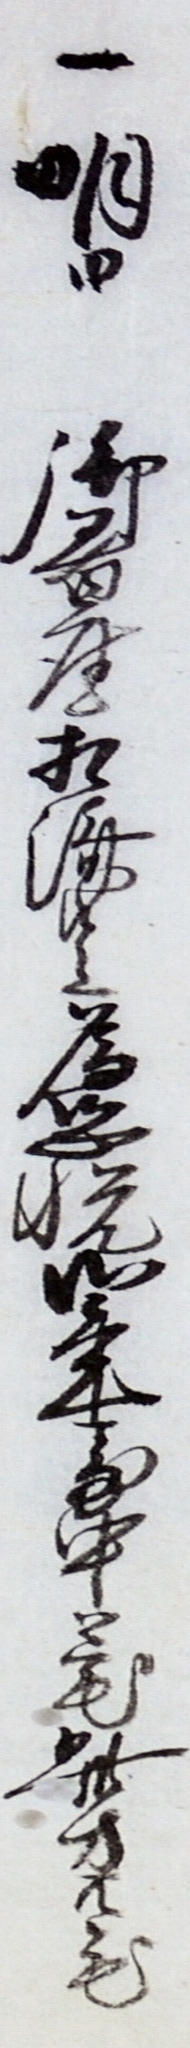一明日御着座相済候上為恐悦御年寄中御宅此方共宅
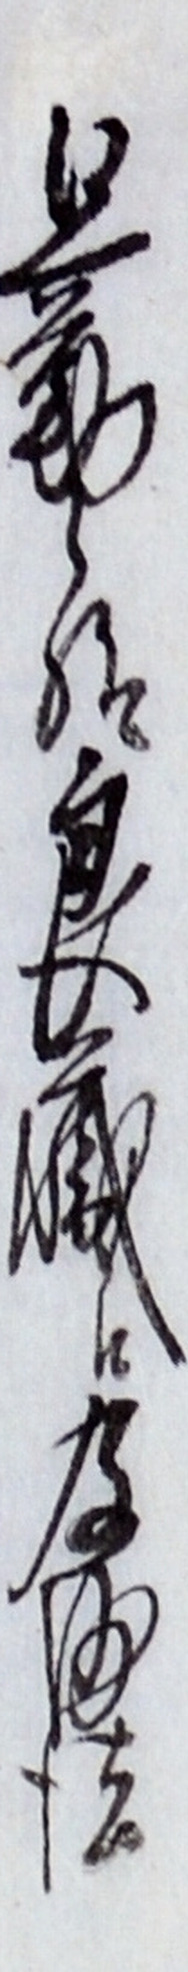廻勤候様良蔵江及沙汰
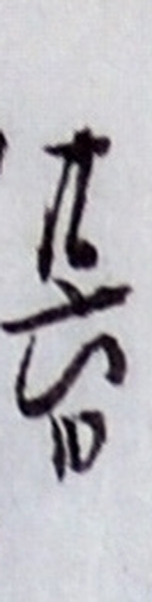廿六日
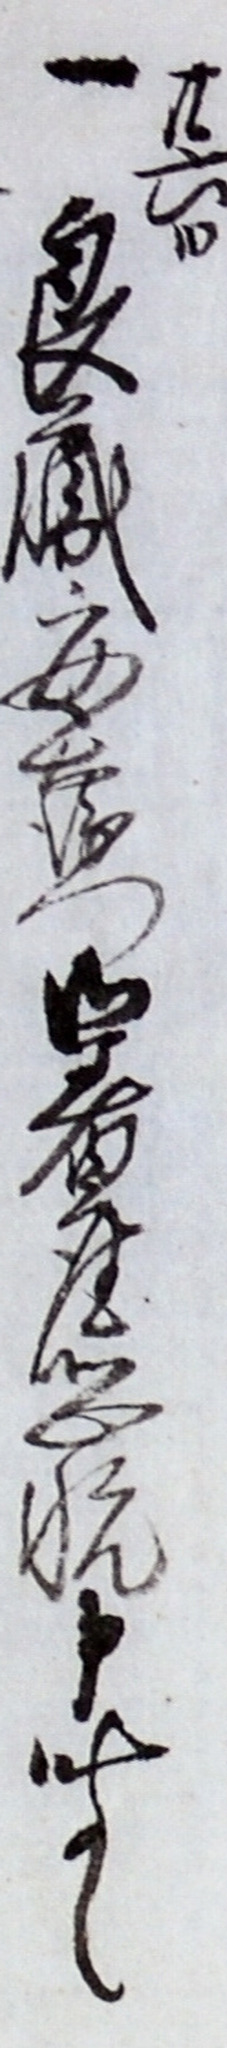一良蔵安右衛門御着座恐悦申聞候
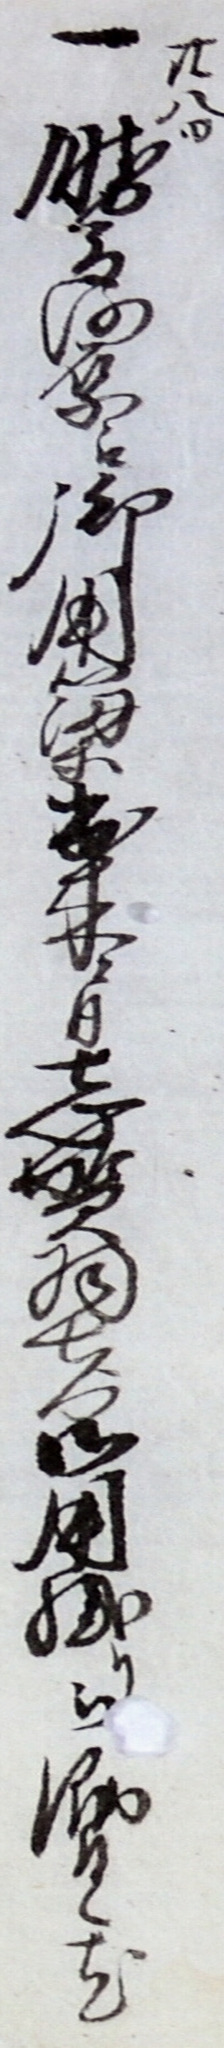一勝間河原被御用簗等出来ニ付志賀羽右衛門御用掛り被仰付尤
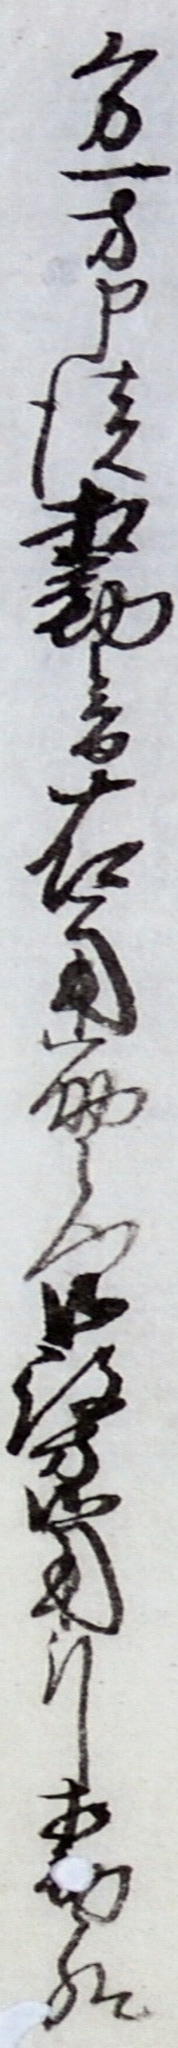分一方申談相勤候旨右用筋之内御役方御用引相勤候様
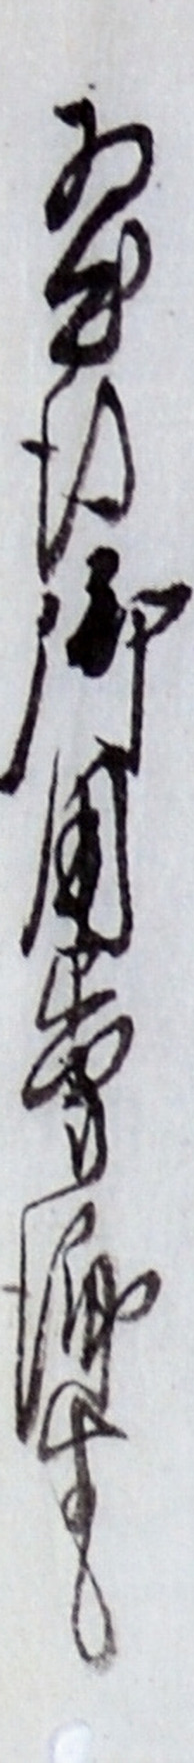為心得御用番被仰聞候

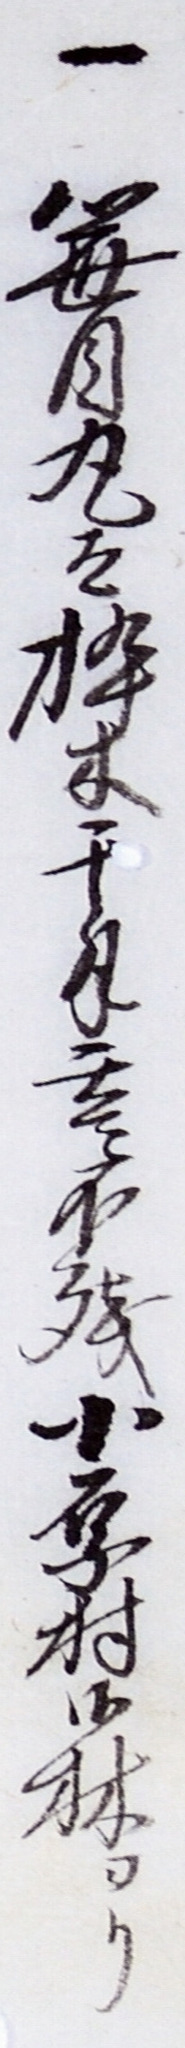一笹目丸太枠木其外共ニ不残小原村御林ヨリ
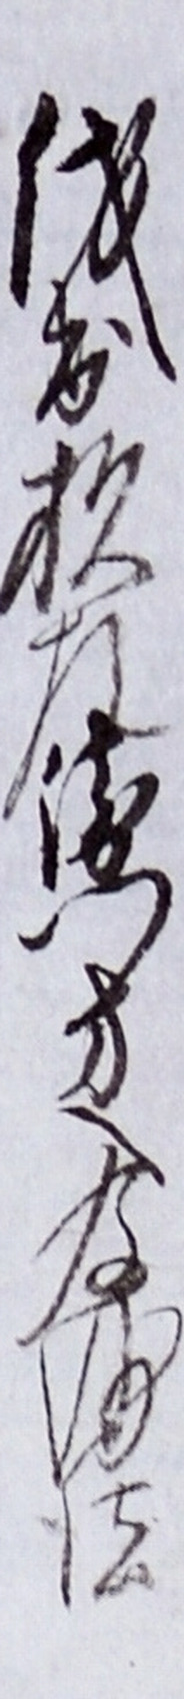伐出杉左衛門方へ及沙汰
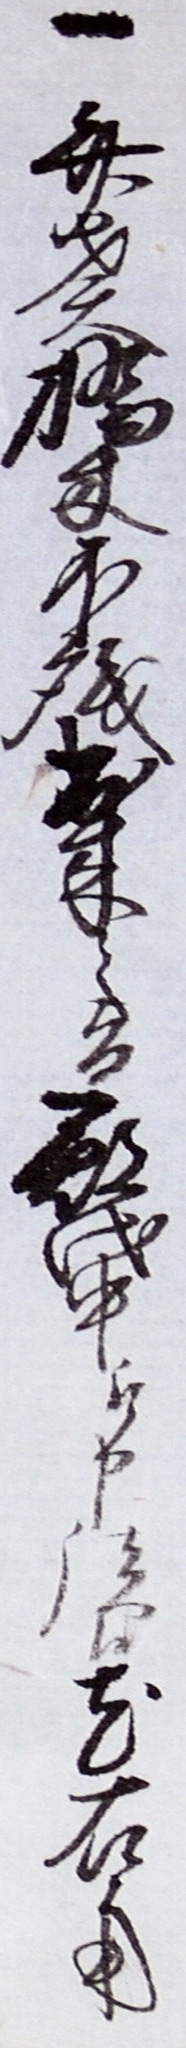一弁才天橋木不残出来之旨郡代中江申談候尤右用
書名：御山奉行御用控
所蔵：伊那市立高遠町図書館・合同会社AMANE
